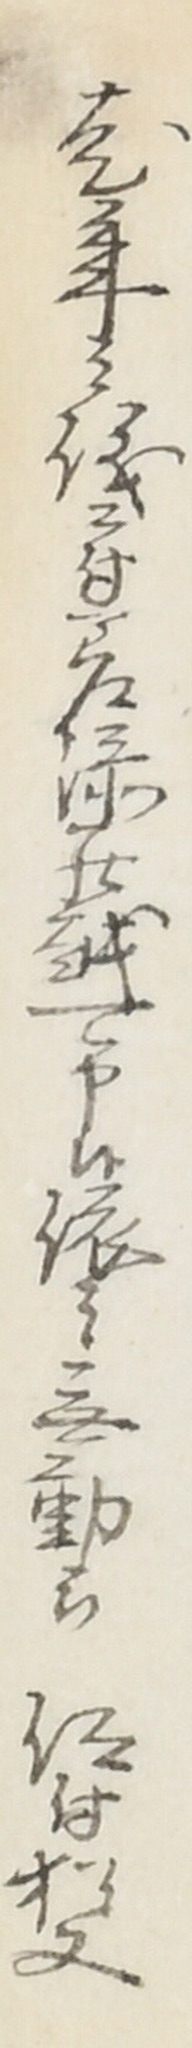老年之儀ニ付差添罷越可申候依之無勤被仰付猶又
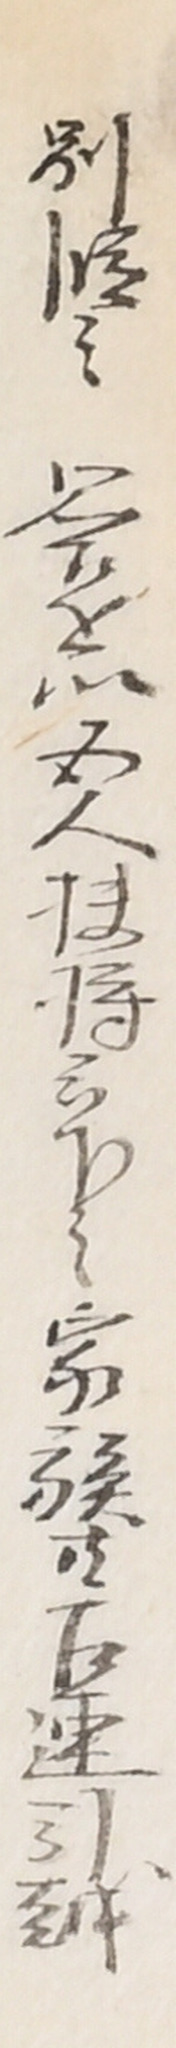別段之思召を以五人扶持被下之家族共召連引越
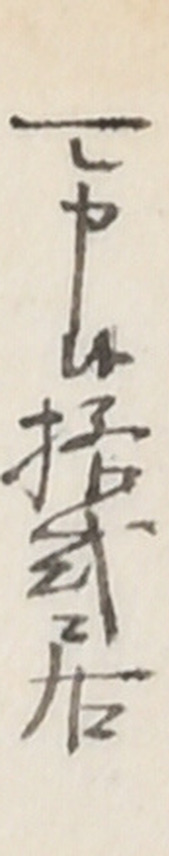可申候格式居
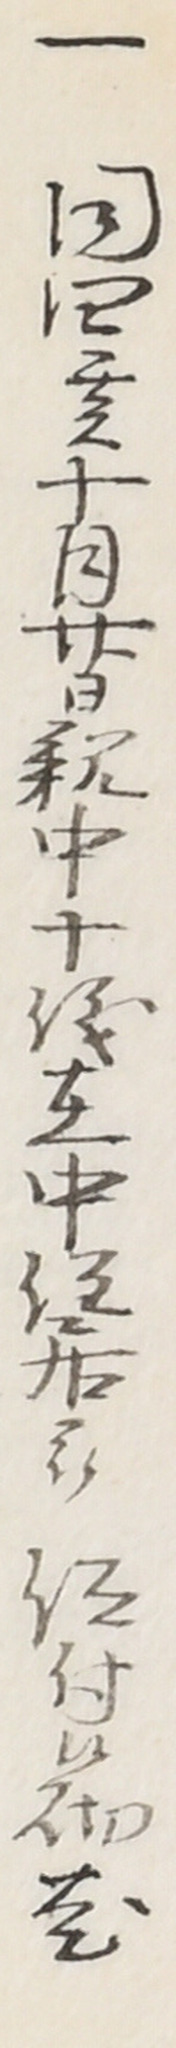一同四亥十月廿日親中十儀在中住居被仰付候砌老
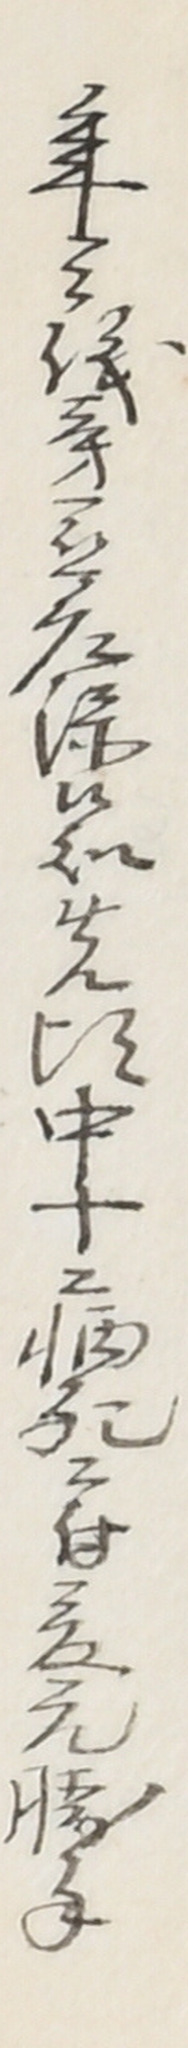年之儀旁被差添候処先頃中十病死ニ付度元勝手

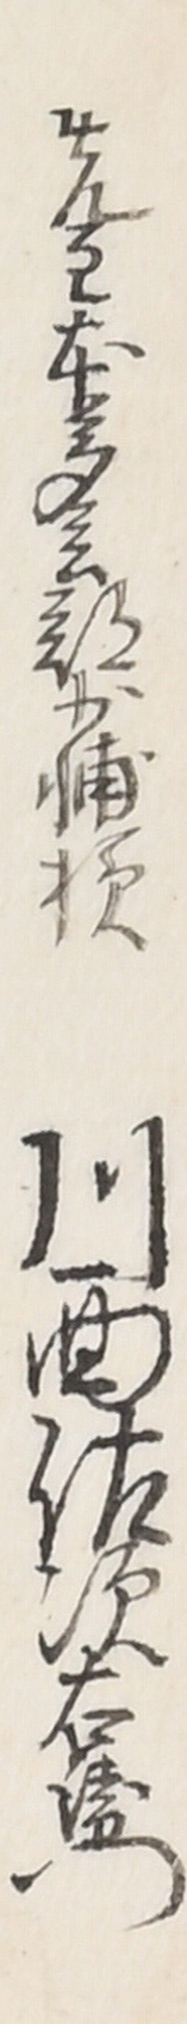先主本多兵部少輔様川西佐次右衛門
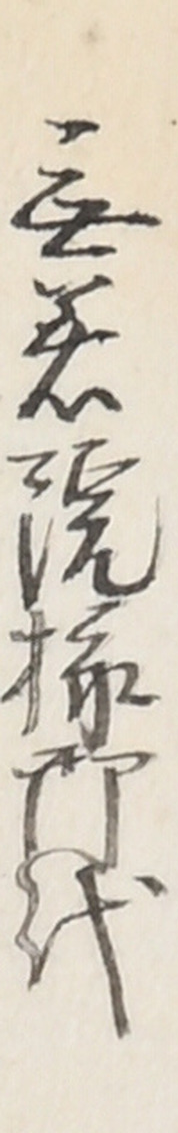無着院様御代
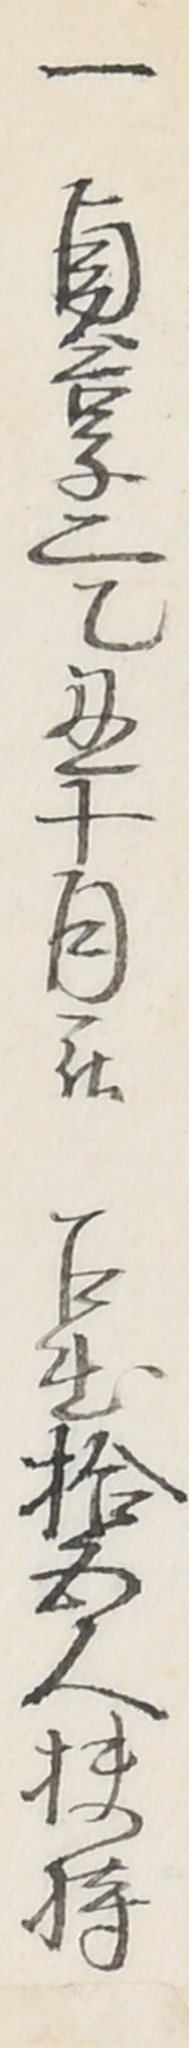一貞享二乙丑十月被召出拾五人扶持
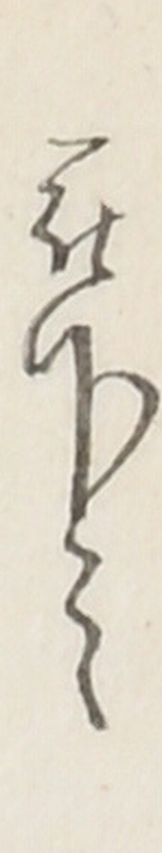被下之
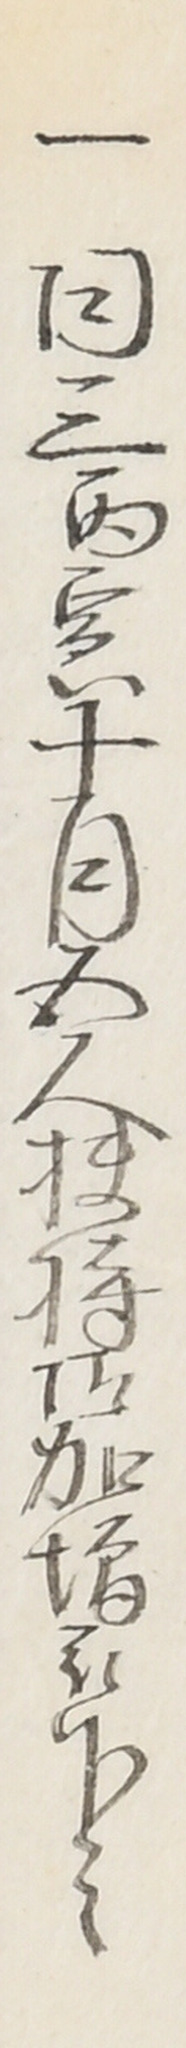一同三丙寅十月五人扶持御加増被下之
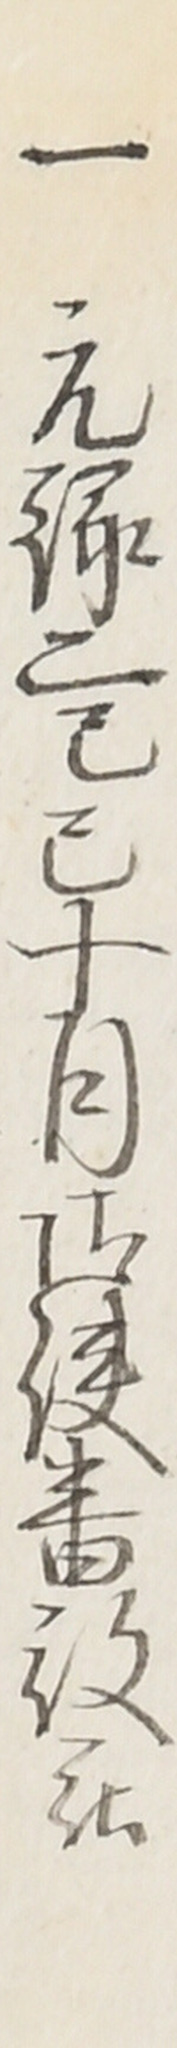一元禄二己巳十月御使番役被
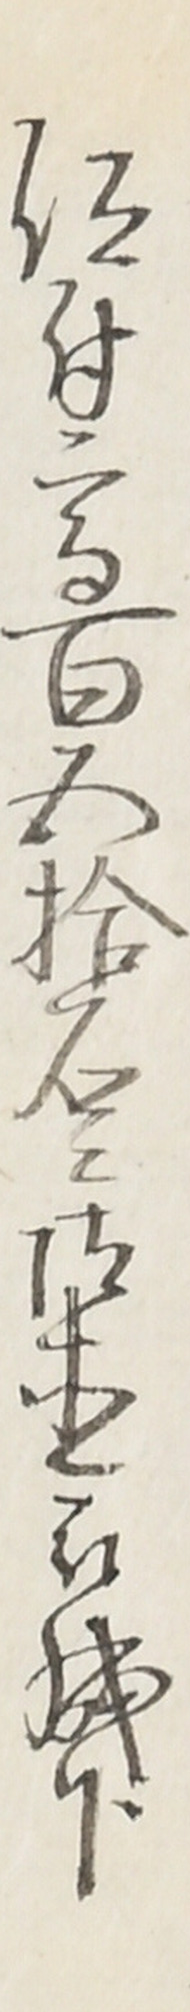仰付高百五拾石ニ御直被成下
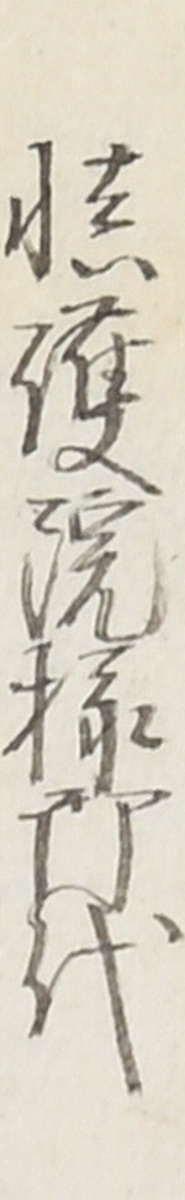慎護院様御代
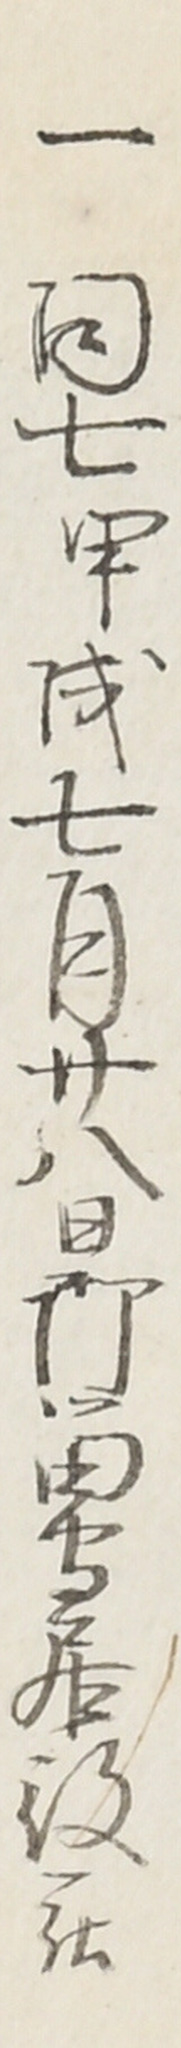一同七甲戌七月廿八日御留守居役被
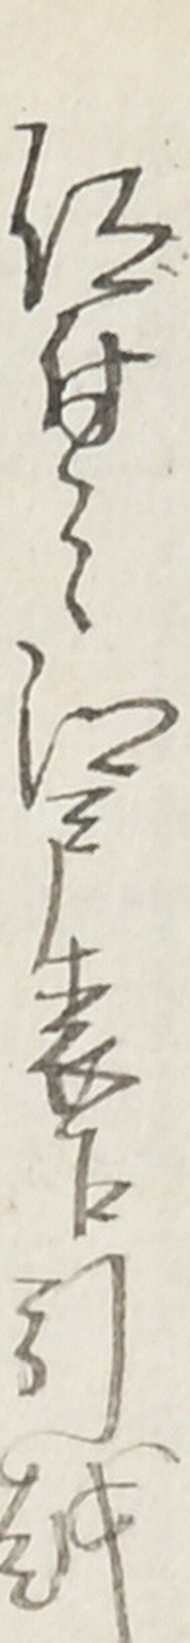仰付之江戸表江引越
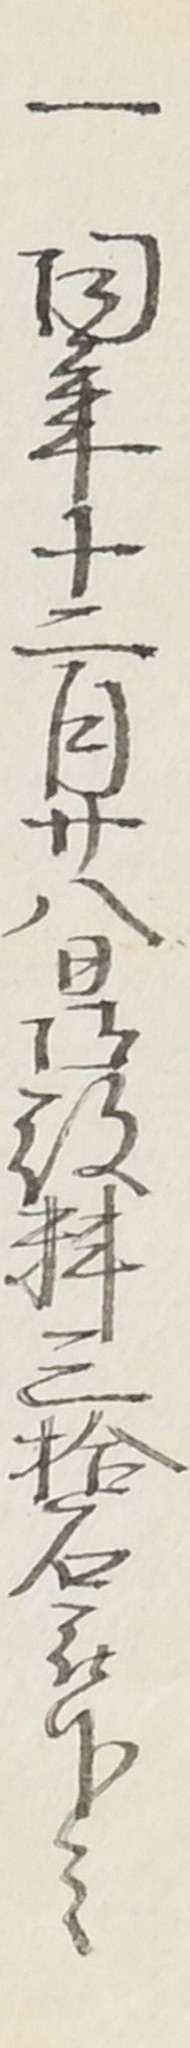一同年十二月廿八日御役料三拾石被下之
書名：給人諸士勤仕録（七）
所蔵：伊那市立高遠町図書館・合同会社AMANE
